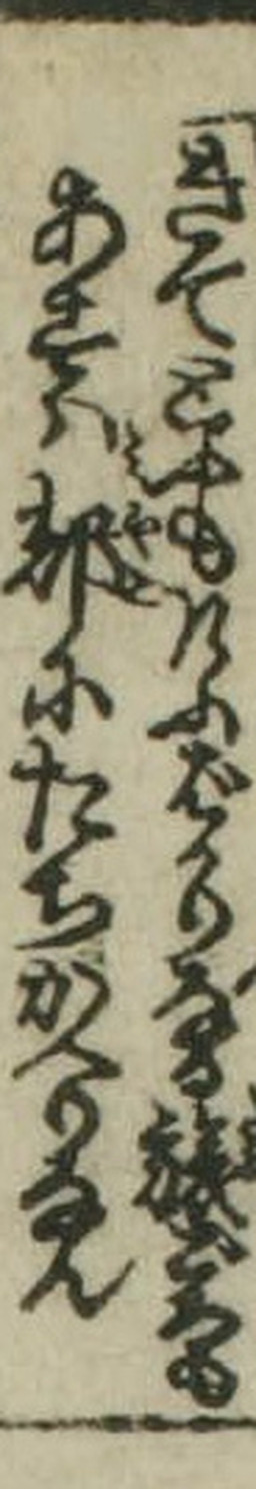あすは都にたちかへりなん
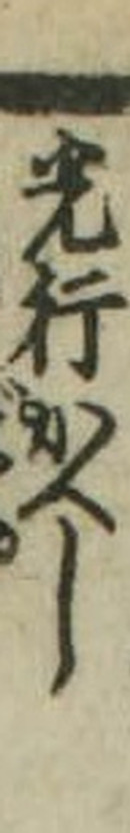光行かへし
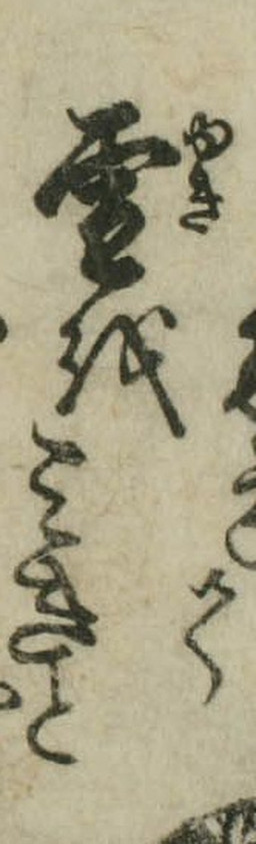雪をみきと
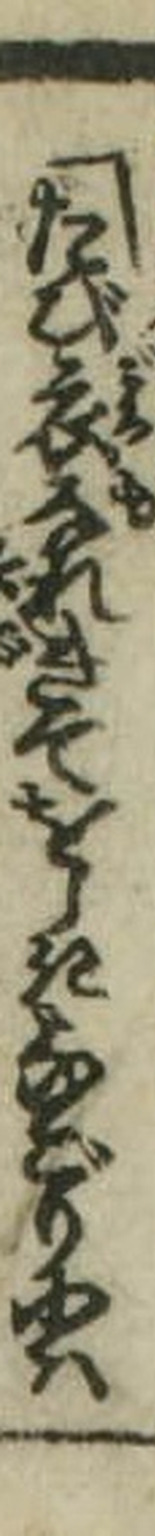〽たび衣なれきてをしきなごりには
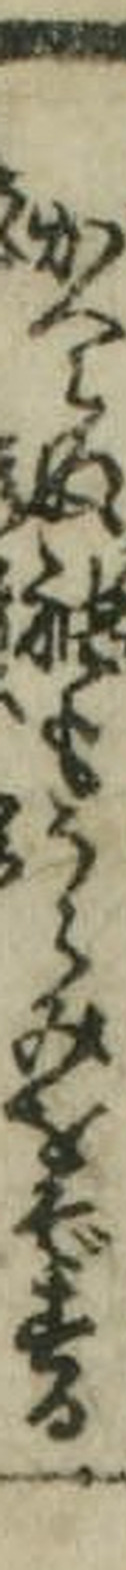かへらぬ袖もうらみをぞする
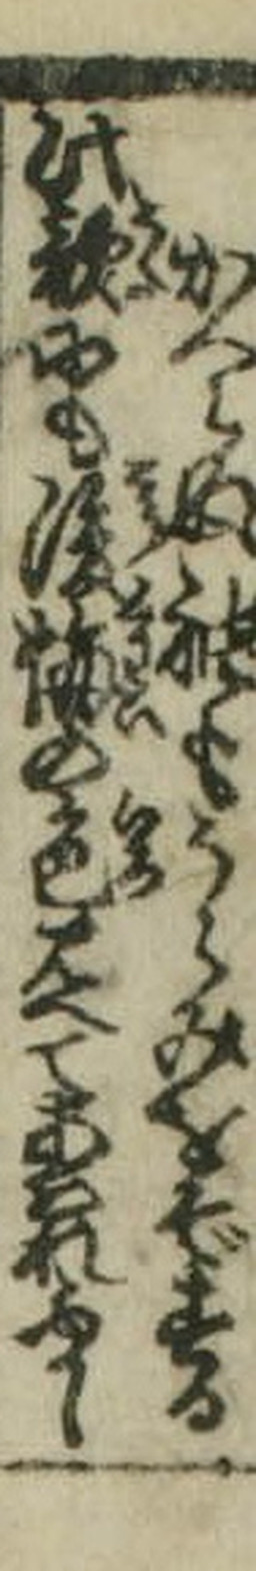此歌にも後悔の色見へてあはれふかし
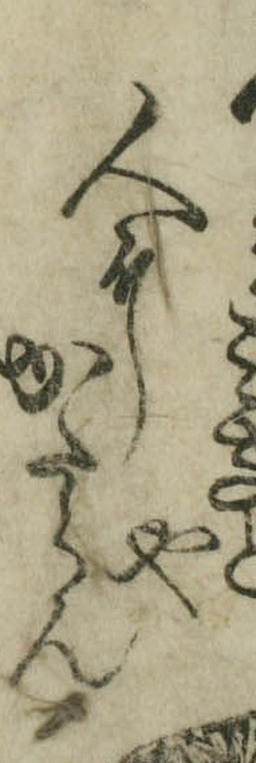かたらん
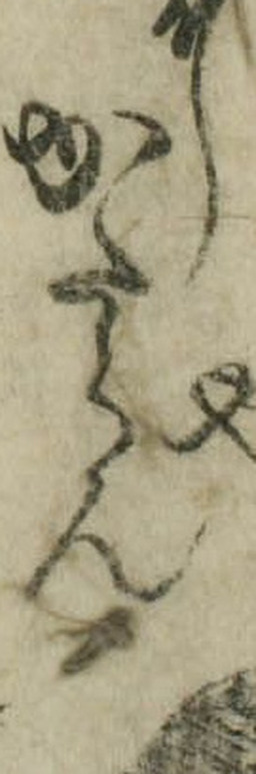かたらん
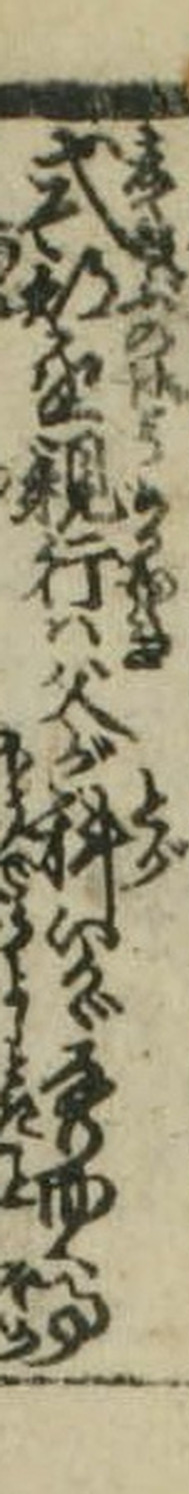式部丞親行は父が科いかゞなりゆく事
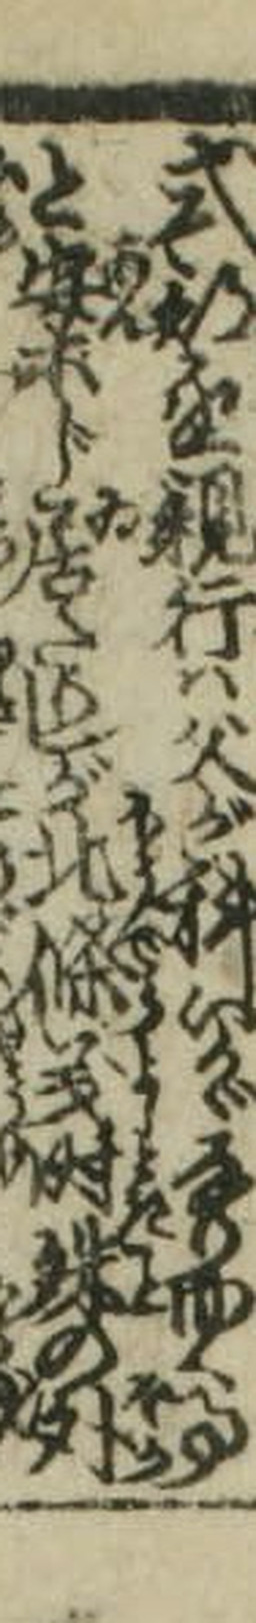と案じ居たりしが北条義時殊の外
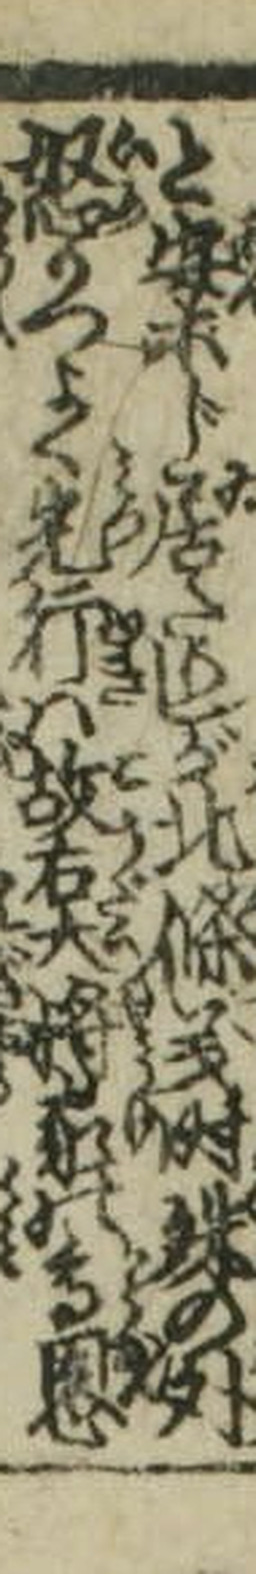怒りつよく光行は故右大将家の高恩
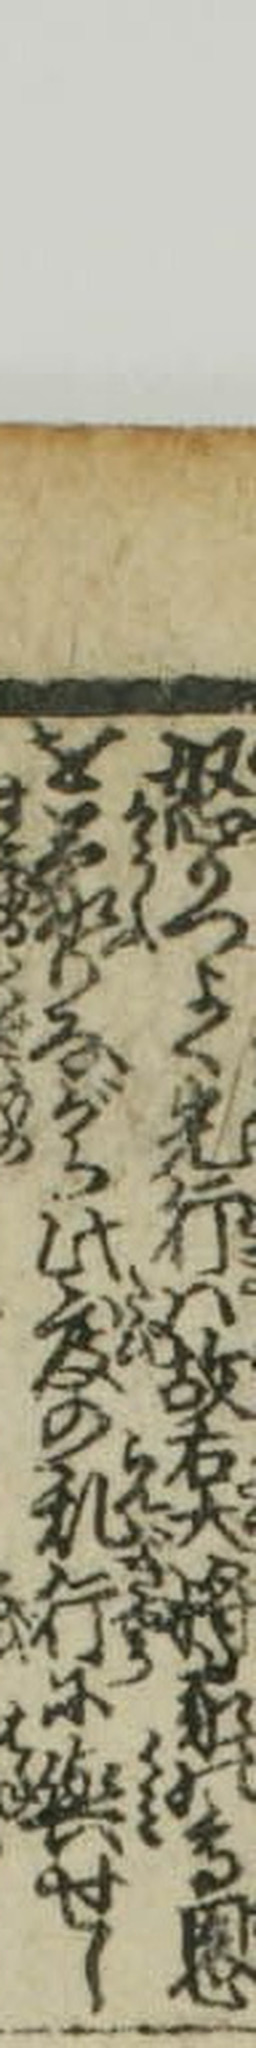を蒙りながら此度の乱行に与せし
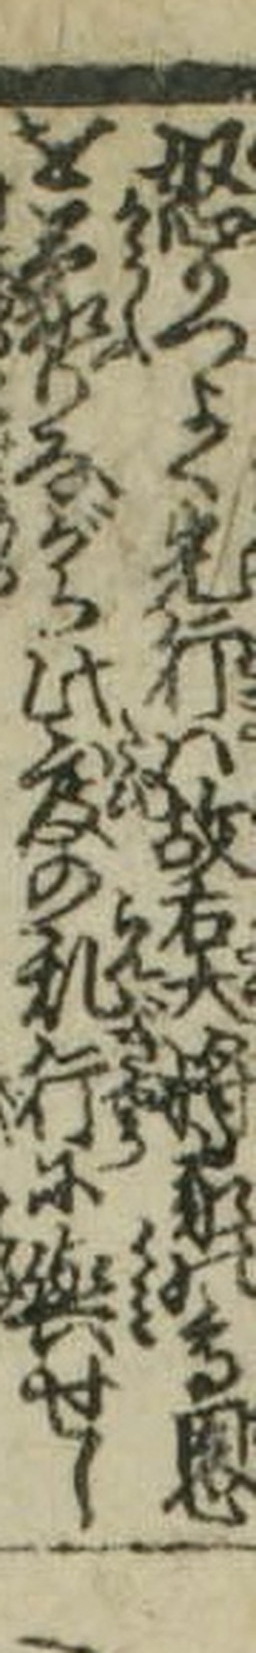を蒙りながら此度の乱行に与せし
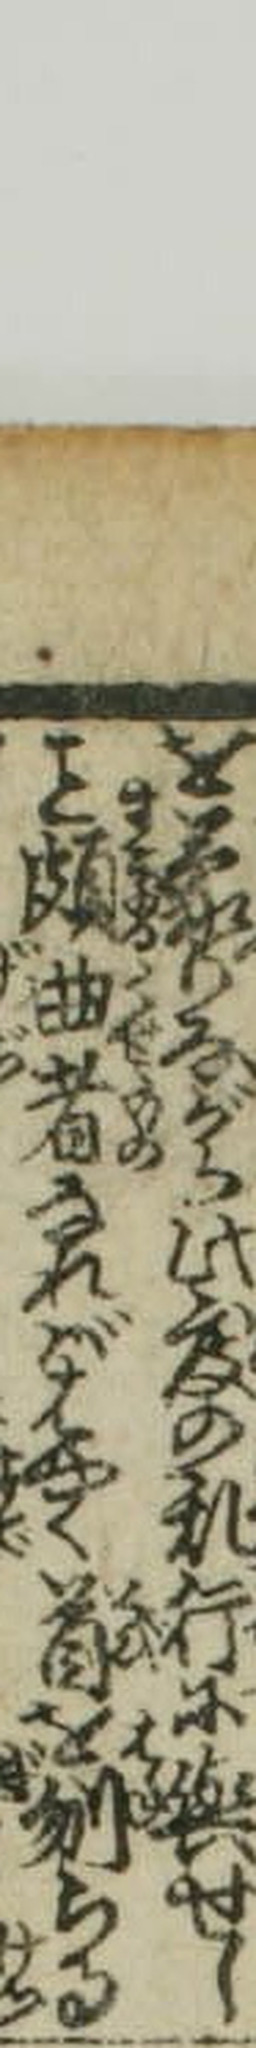を頗曲者なればはやく首を刎らる
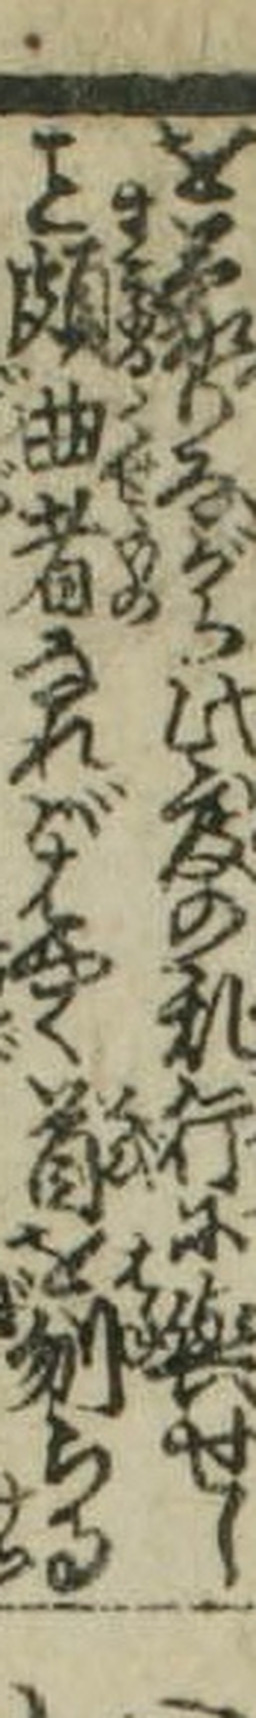を頗曲者なればはやく首を刎らる
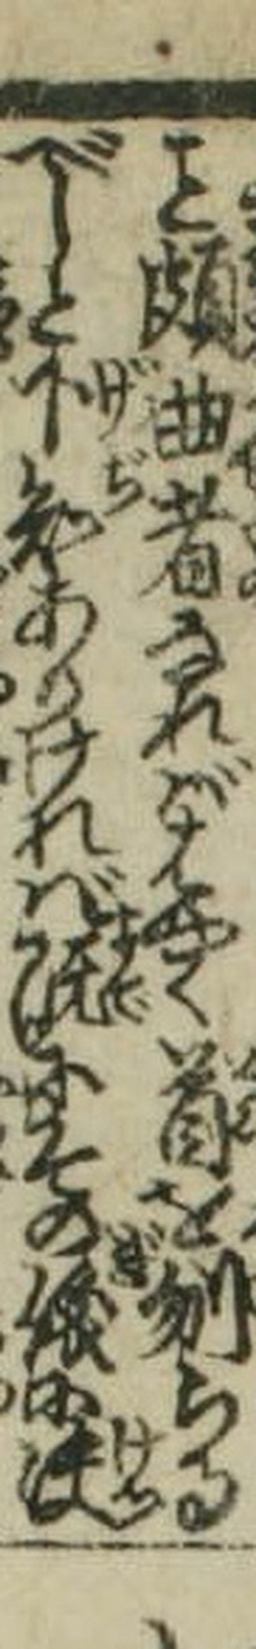べしと下知ありければ既にその儀に決
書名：續英雄百人一首
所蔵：東京学芸大学附属図書館
